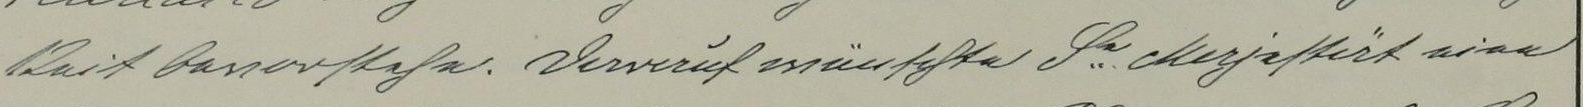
keit bevorstehe. Darauf wünschte Se. Majestät eine
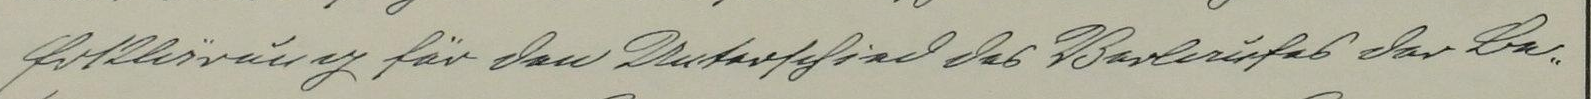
Erklärung für den Unterschied des Verlaufes der Be-
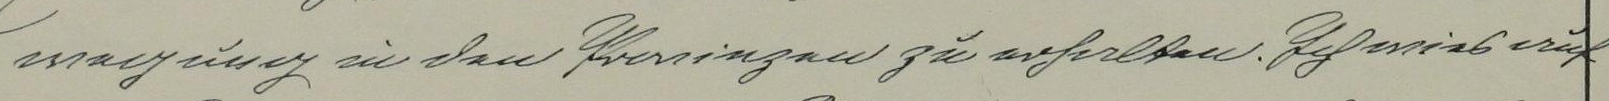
wegung in den Provinzen zu erhalten. Ich wies auf
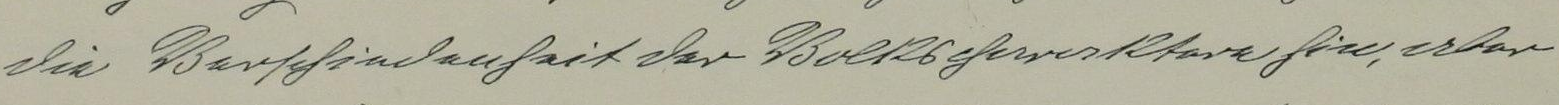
die Verschiedenheit der Volkscharaktere hin, aber
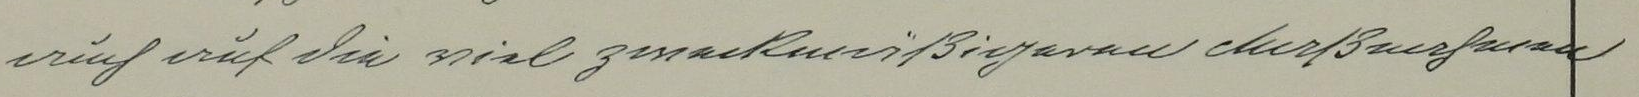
auch auf die viel zweckmäßigeren Maßnahmen
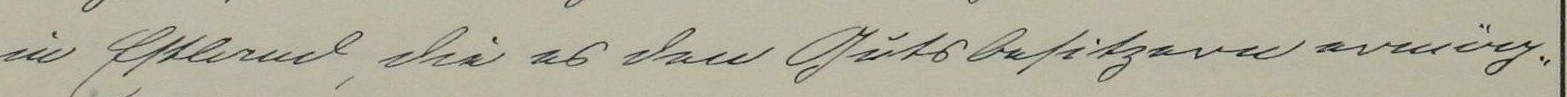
in Estland, die es den Gutsbesitzern ermög-
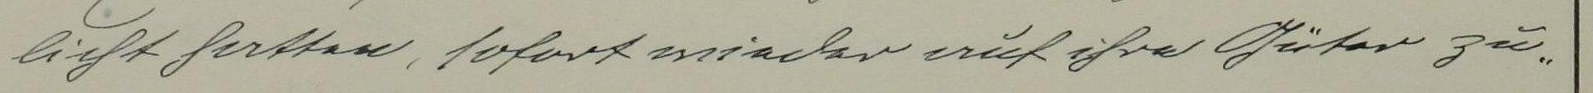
licht hatten, sofort wieder auf ihre Güter zu-
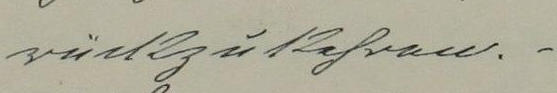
rückzukehren.
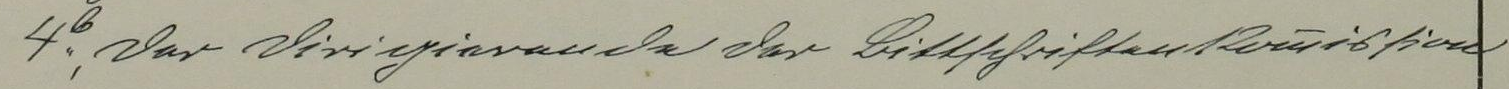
4b. Der Dirigierende der Bittschriftenkommission
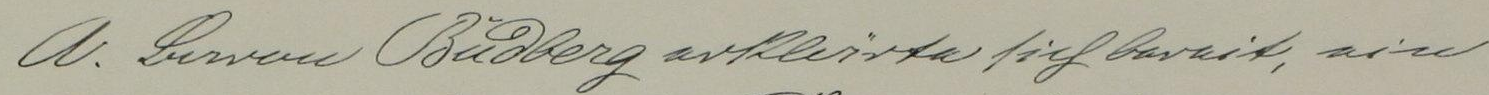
A. Baron Budberg erklärte sich bereit, ein
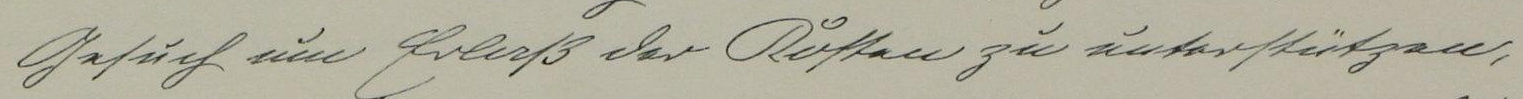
Gesuch um Erlaß der Kosten zu unterstützen,
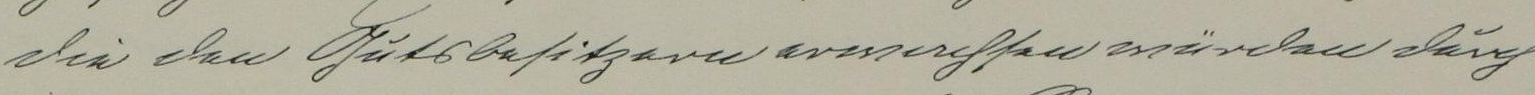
die den Gutsbesitzern erwachsen würden durch
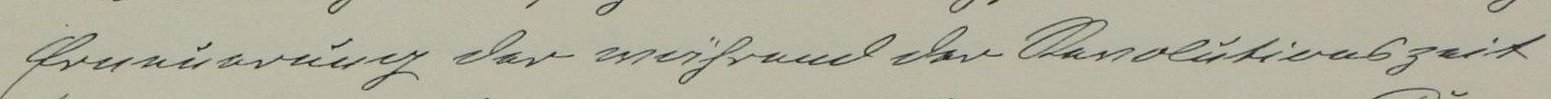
Erneuerung der während der Revolutionszeit
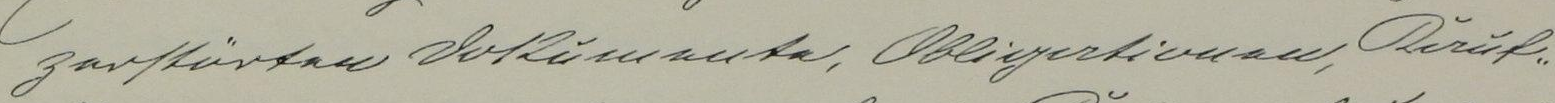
zerstörten Dokumente, Obligationen, Kauf-
